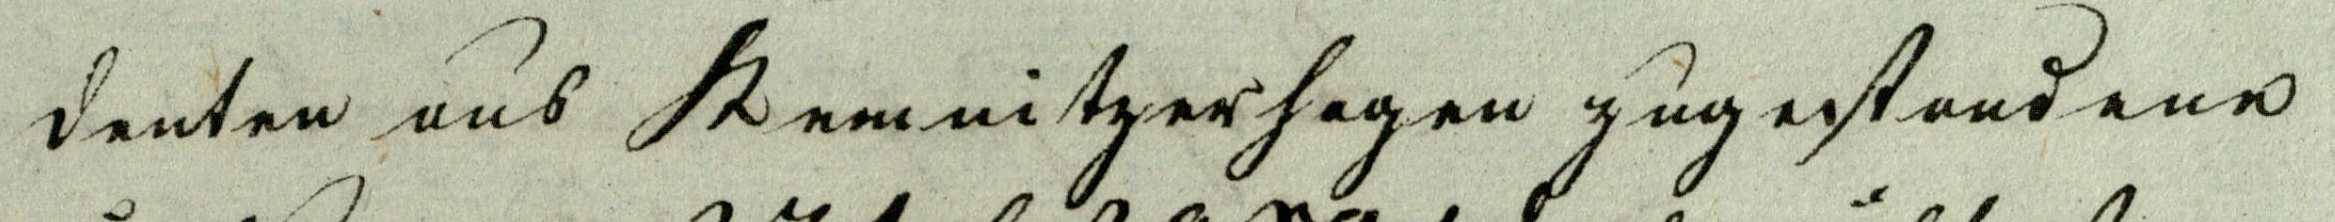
denten aus Kemnitzerhagen zugestandene
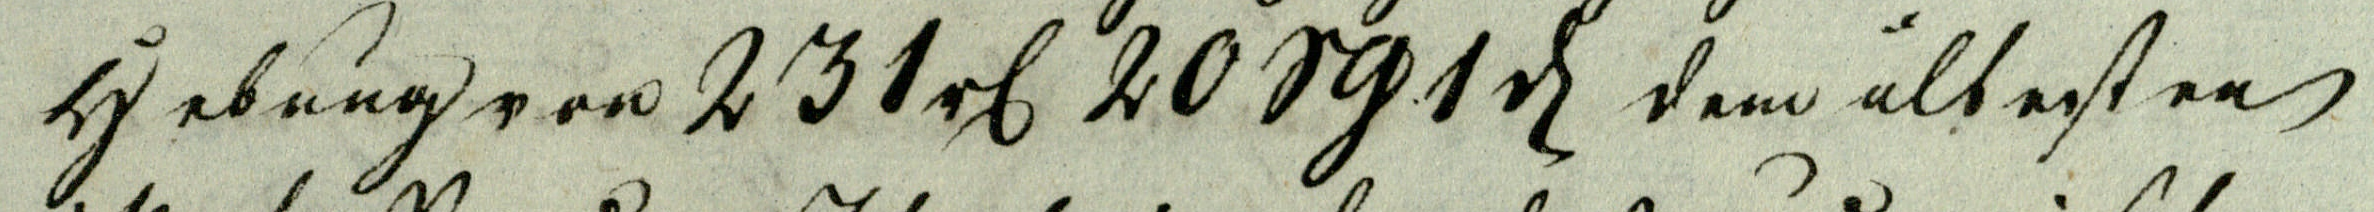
Hebung von 231 r 20 SGs d dem ältesten
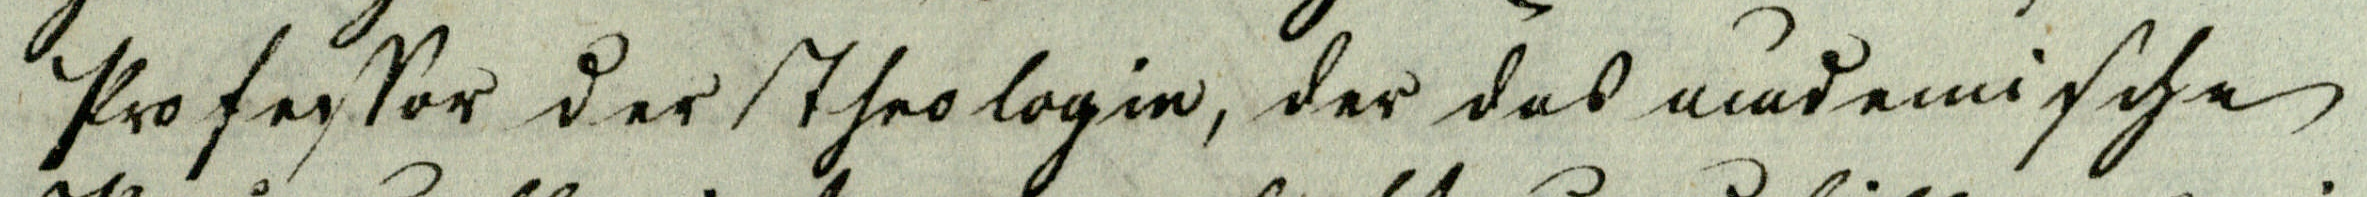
Professor der Theologie, der das academische
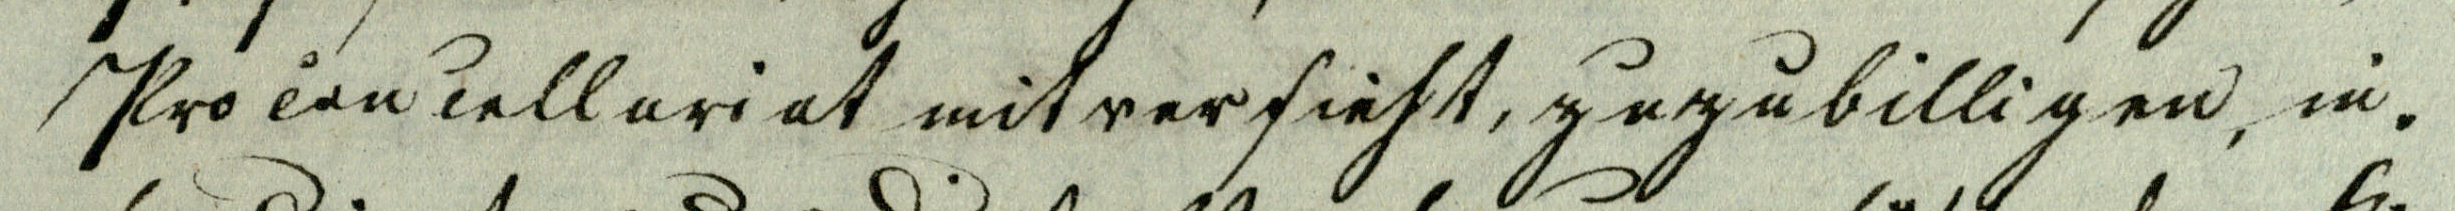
Procancellariat mitversieht, zuzubilligen, in¬
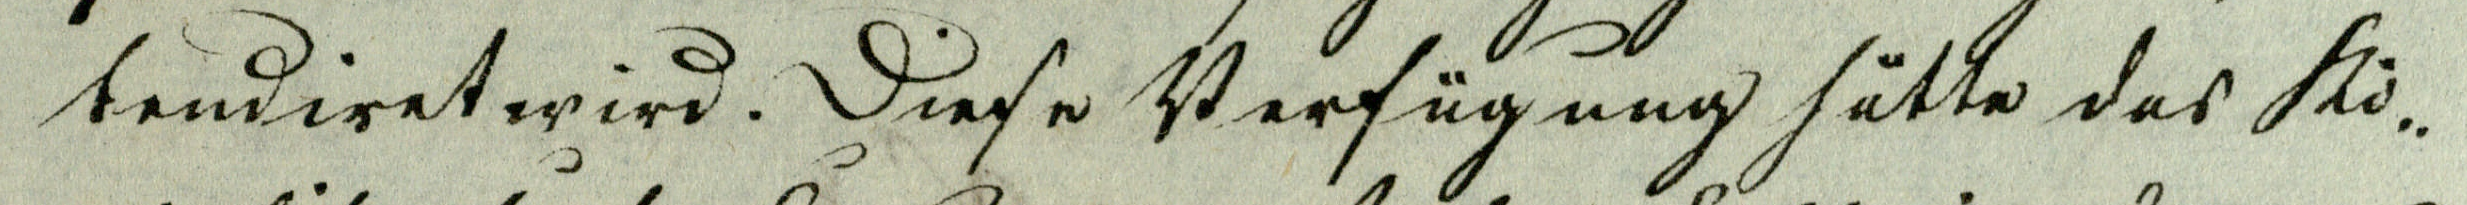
tendiret wird. Diese Verfügung hätte das Kö¬
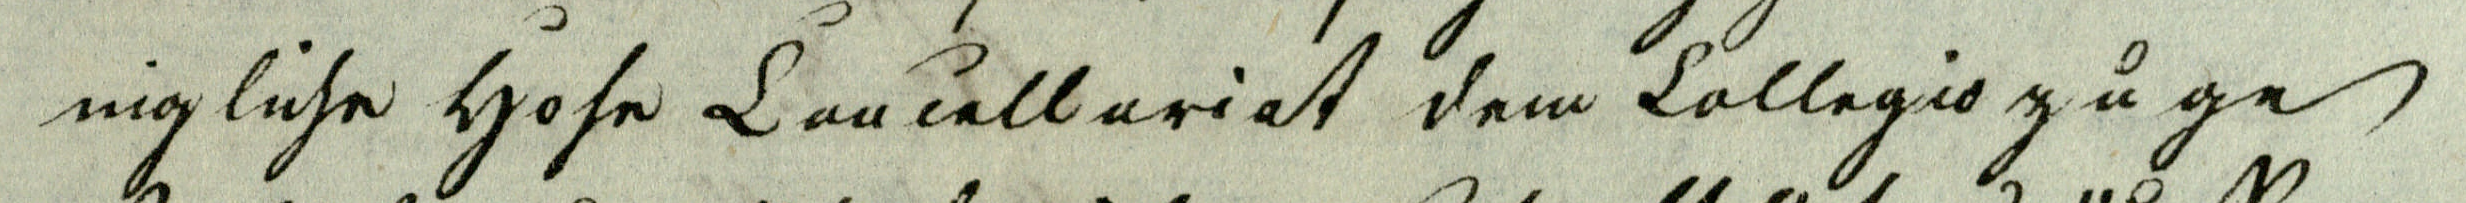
nigliche Hohe Cancellariat dem Collegio zu ge
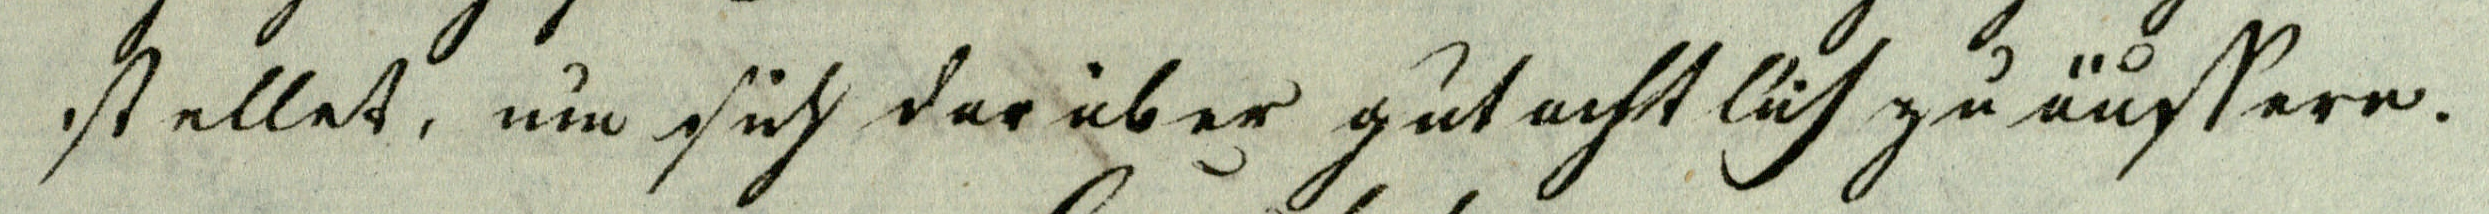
stellet, um sich darüber gutachtlich zu äussern.
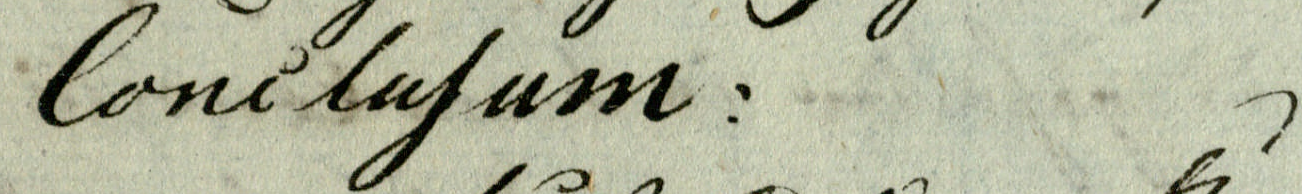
Conclusum:
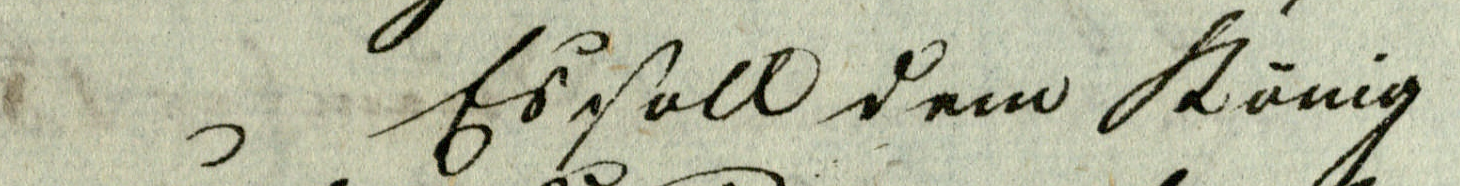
Es soll dem König¬
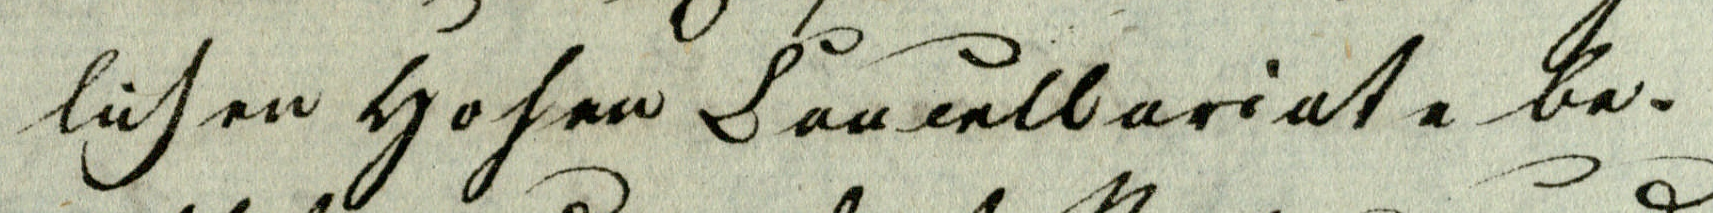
lichen Hohen Cancellariate be¬
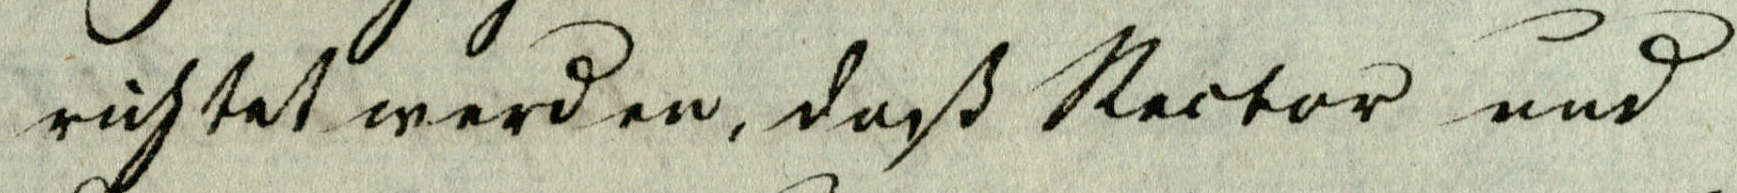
richtet werden, daß Rector und
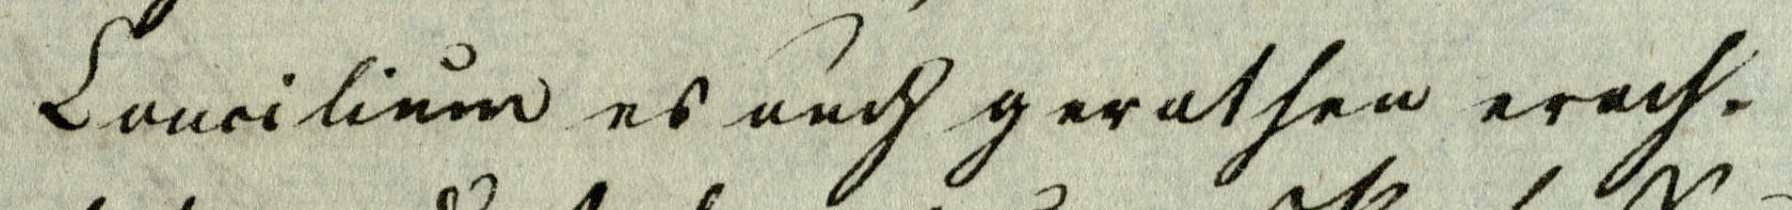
Concilium es auch gerathen erach¬
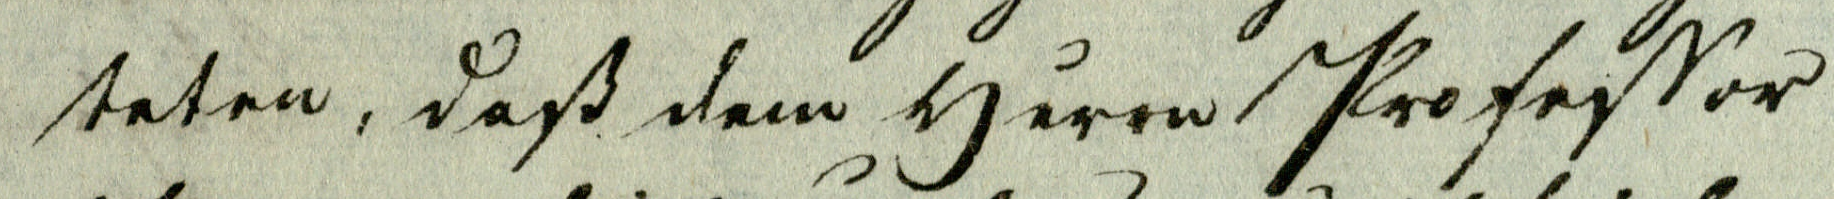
teten, daß dem Herrn Professor
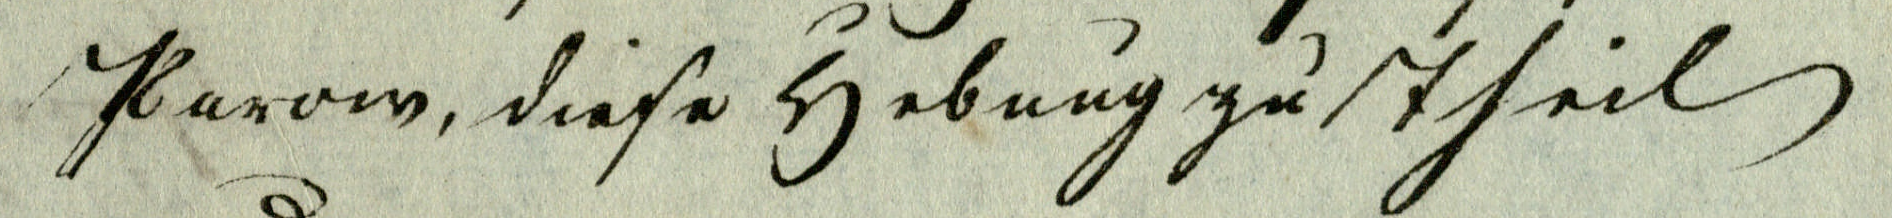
Parow, diese Hebung zu Theil
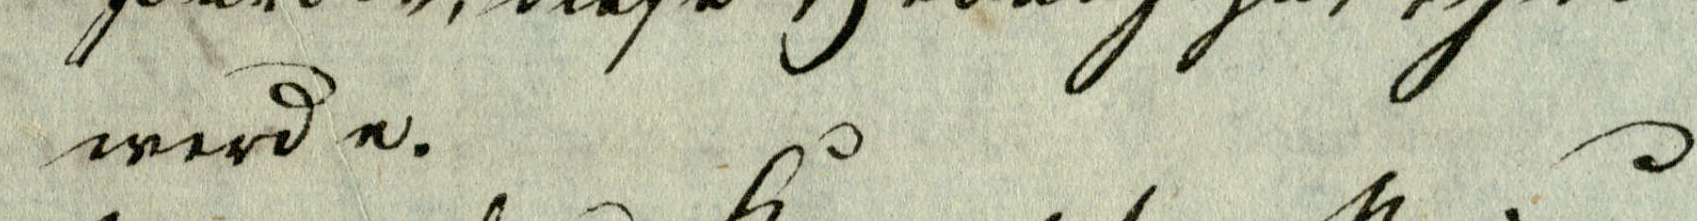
werde.
